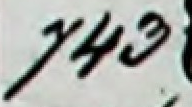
743
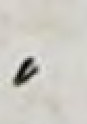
„
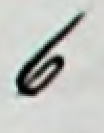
6
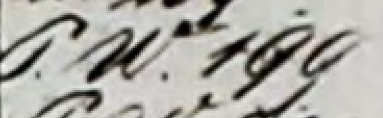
P.W. 199
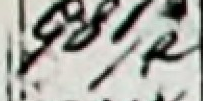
981/a
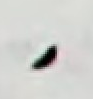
„
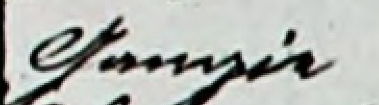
Gamzie
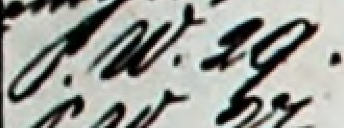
P.W. 29...
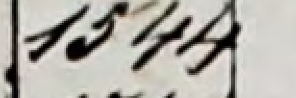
1544
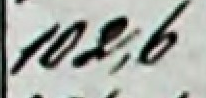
102,6
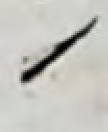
1
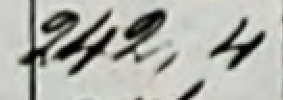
242,4
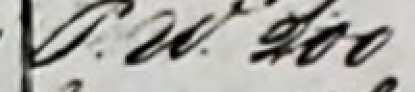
P.W. 200
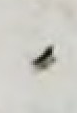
„
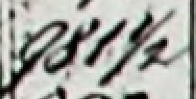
981 1/2
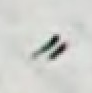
„
